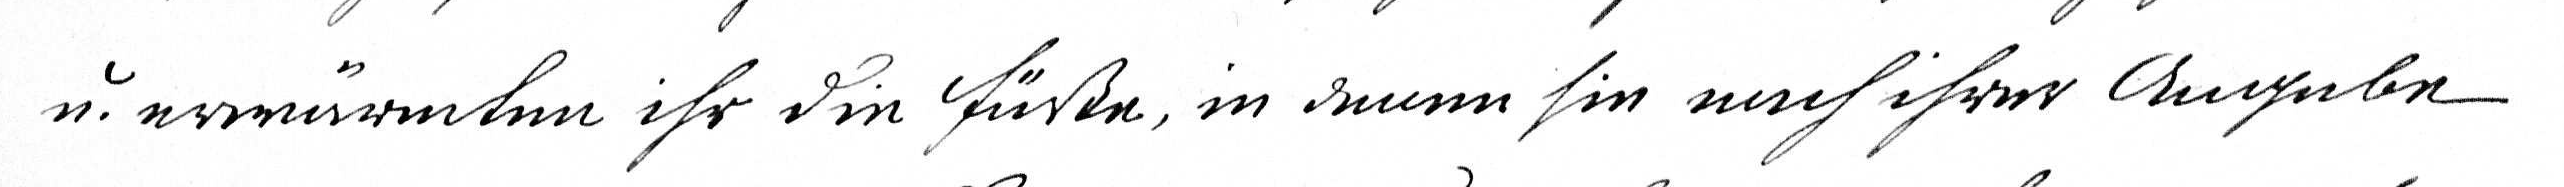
u. erwärmten ihr die Füße, in denen sie nach ihrer Angabe
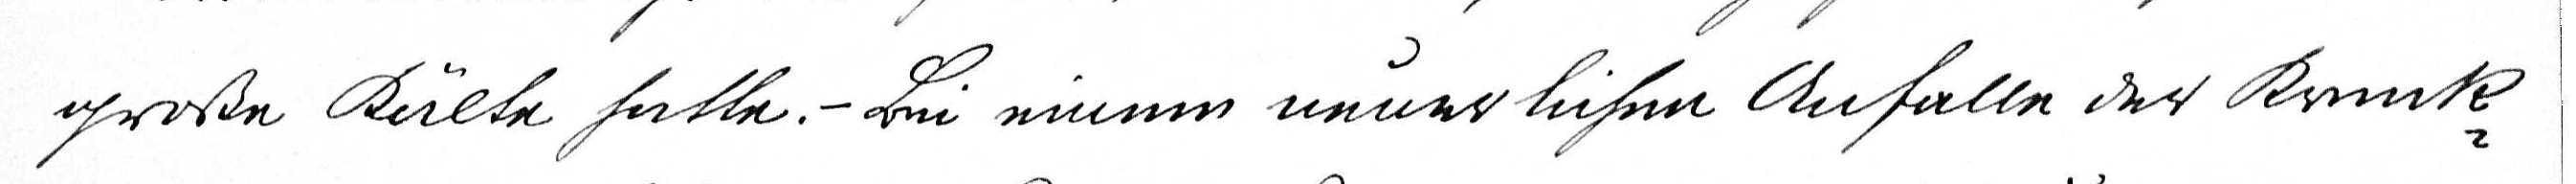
große Kälte hatte. Bei einem neuerlichen Anfalle der Krank¬
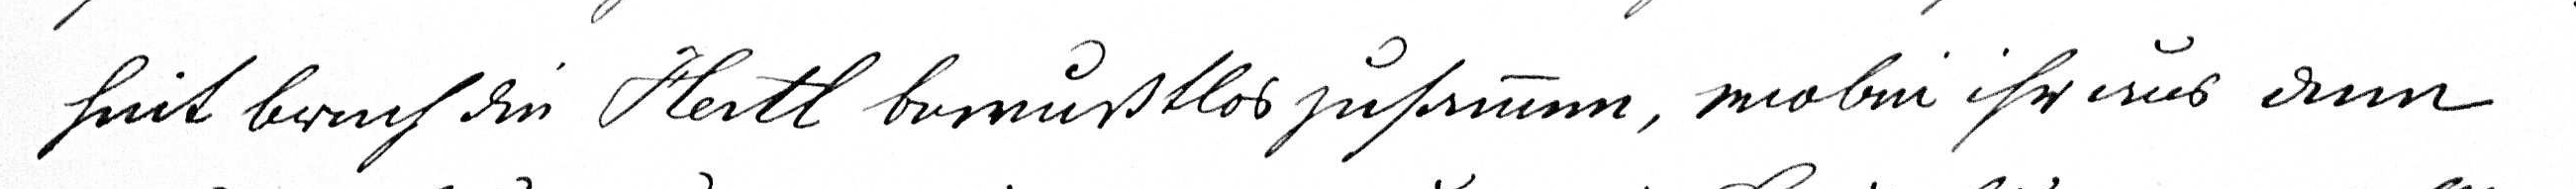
heit brach die Hertl bewustlos zusammen, wobei ihr aus dem
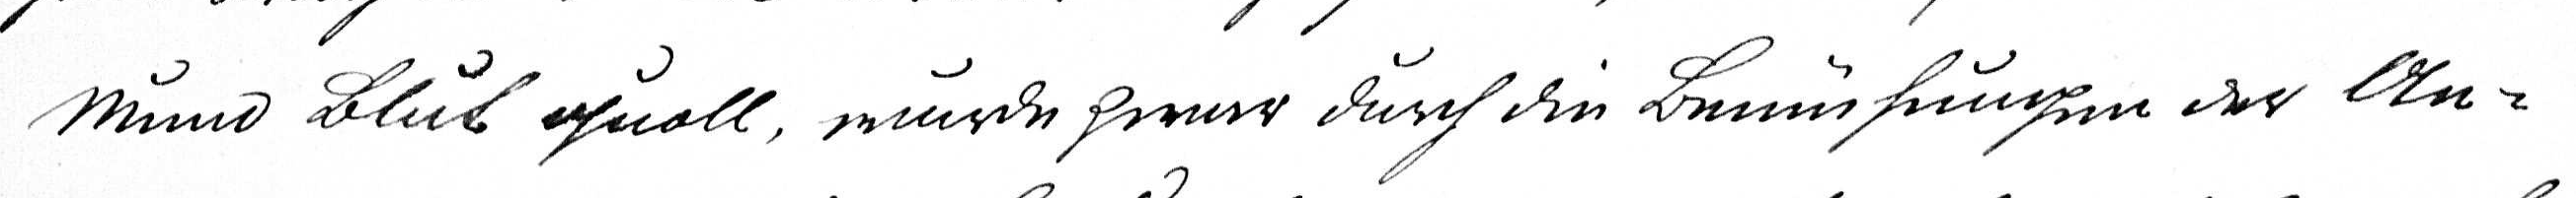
Mund Blut quoll, wurde zwar durch die Bemühungen der An¬
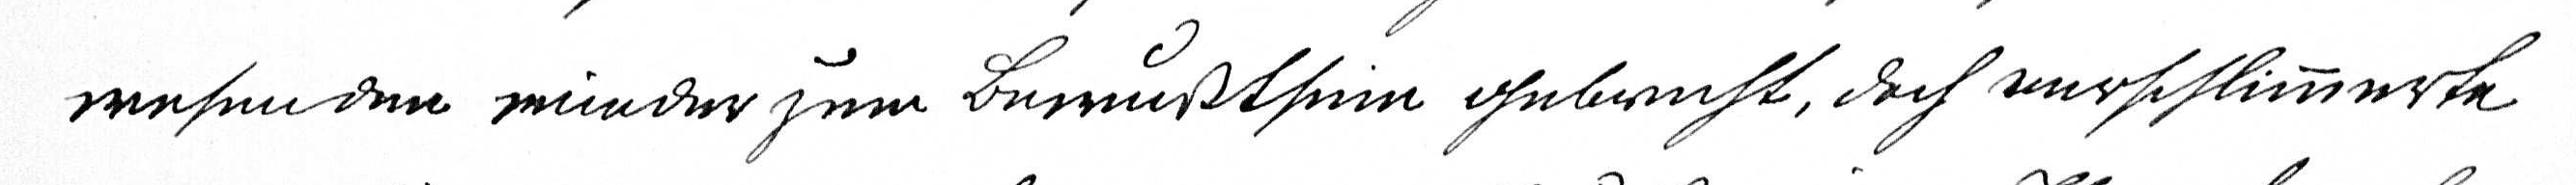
wesenden wieder zu Bewußtsein gebracht, doch verschlimmerte
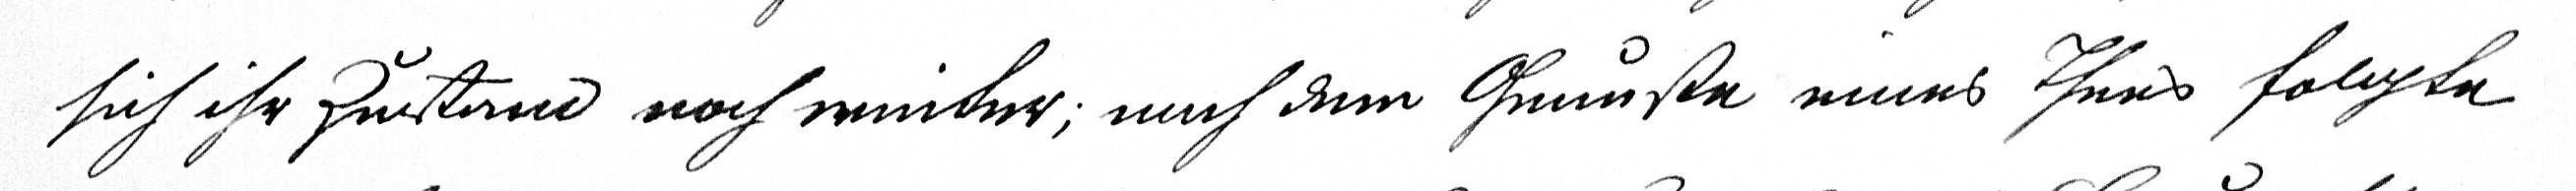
sich ihr Zustand noch wieder, nach dem Genuße eines Thees folgte
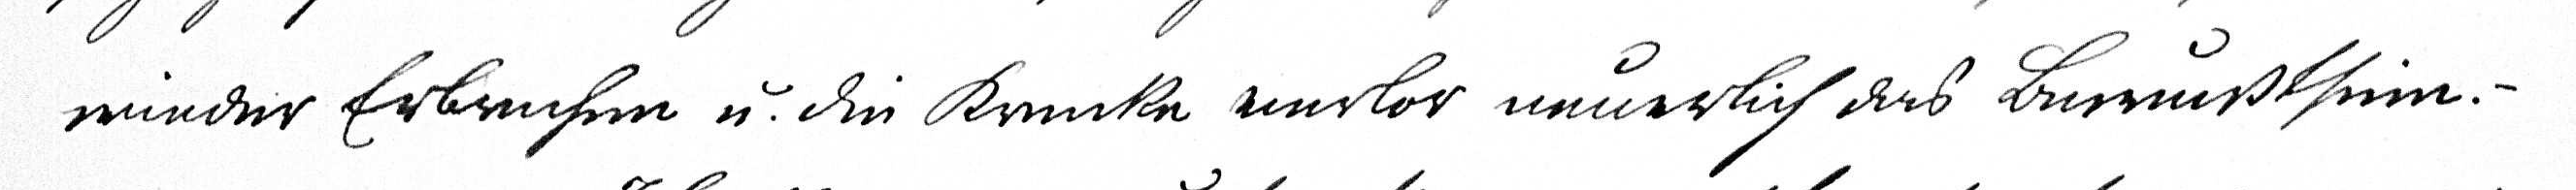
wieder Erbrechen u. die Kranke verlor neuerlich das Bewußtsein.
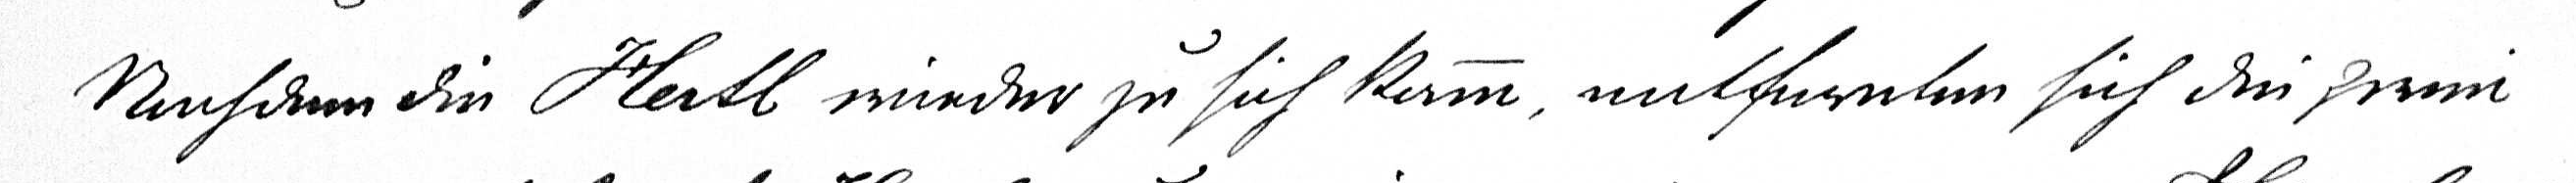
Nachdem die Hertl wieder zu sich kamm, entfernten sich die zwei
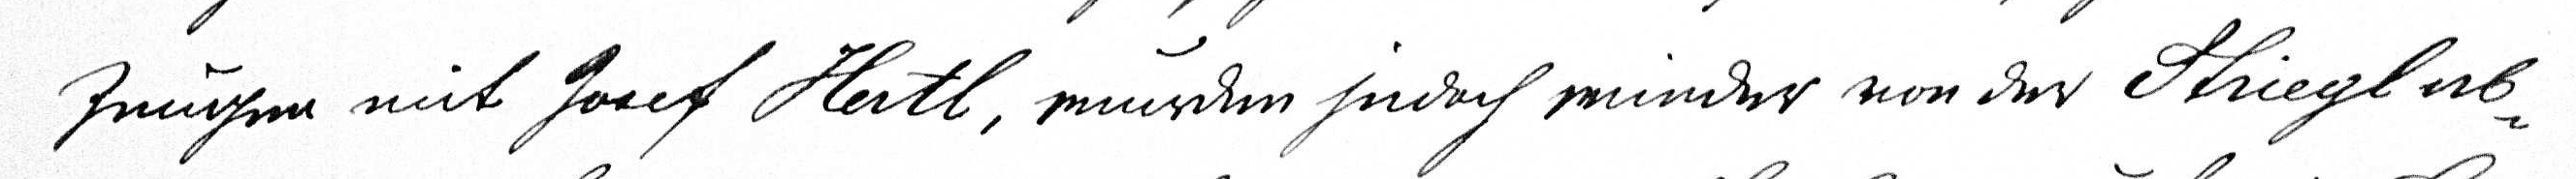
Zeugen mit Josef Hertl, wurden jedoch wieder von der Striegl ab¬
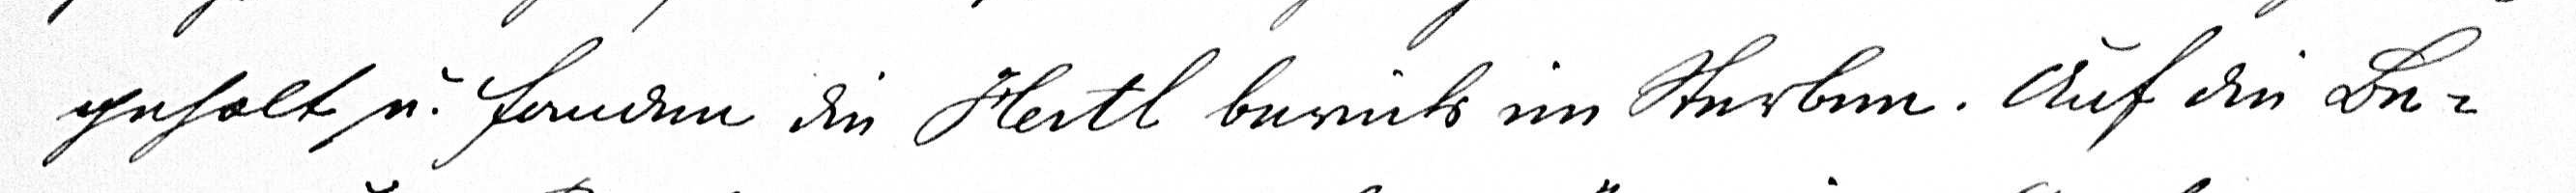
geholt u. fanden die Hertl bereits i Sterben. Auf die Be¬
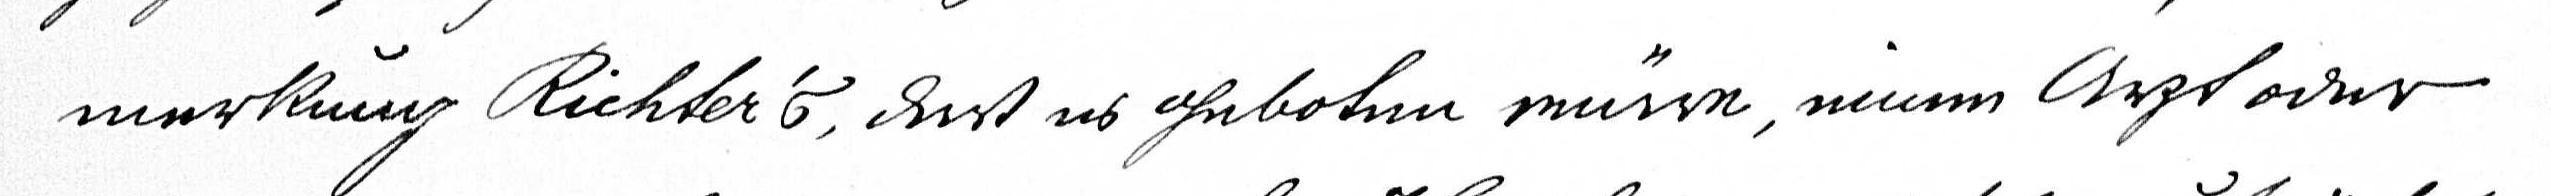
merkung Richter’s, daß es Geboten wäre, einem Arzt oder
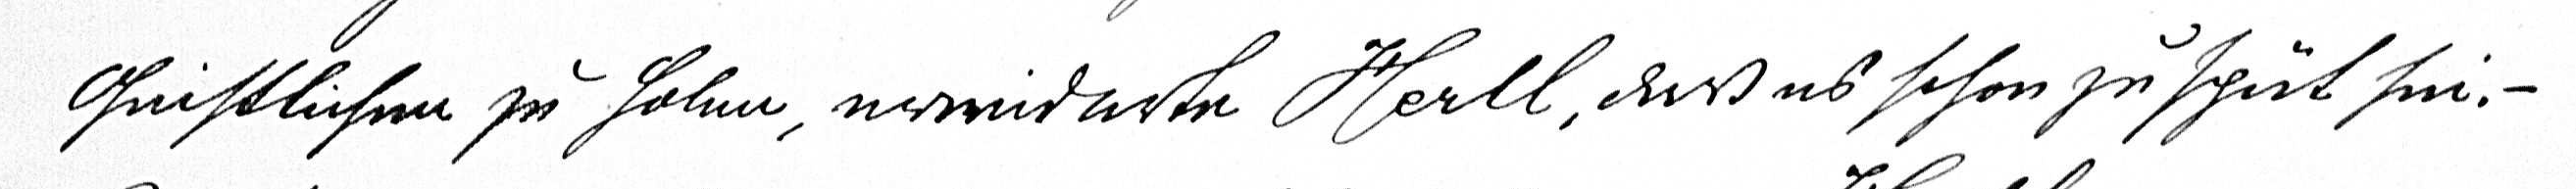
Geistlichen zu holen, erwiderte Hertl, daß es schon zu spät sei.
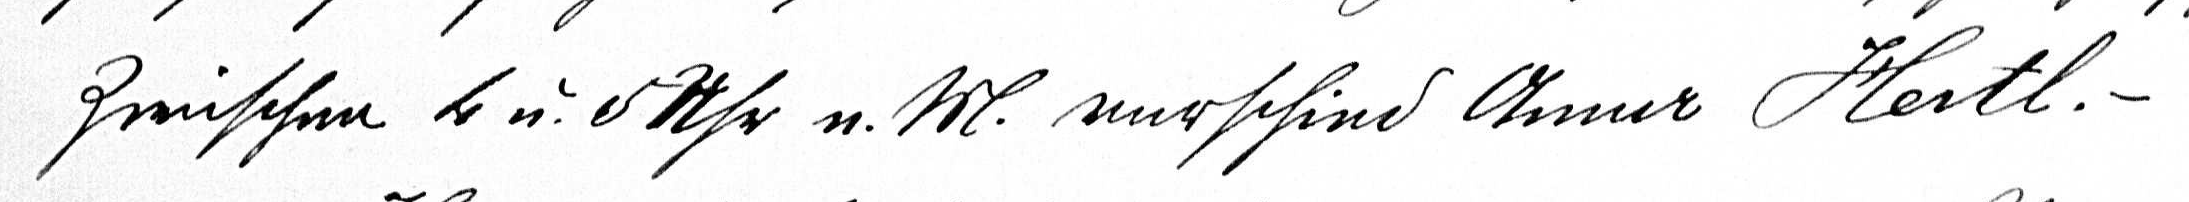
Zwischen 4 u. 5 Uhr n. M. verschied Anna Hertl.
